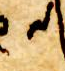2
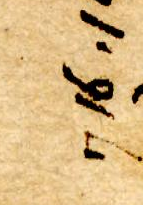716.16
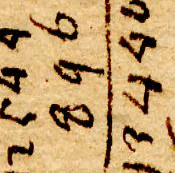896
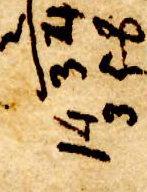1434
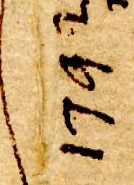1792
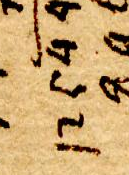12544
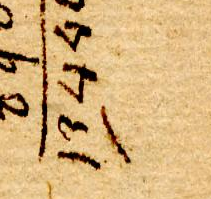13440
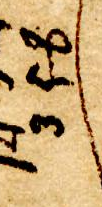358
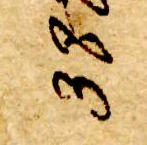388
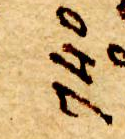740
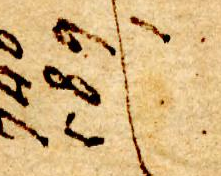589
